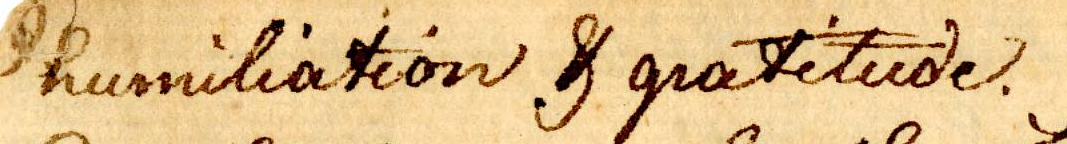humiliation & gratitude.
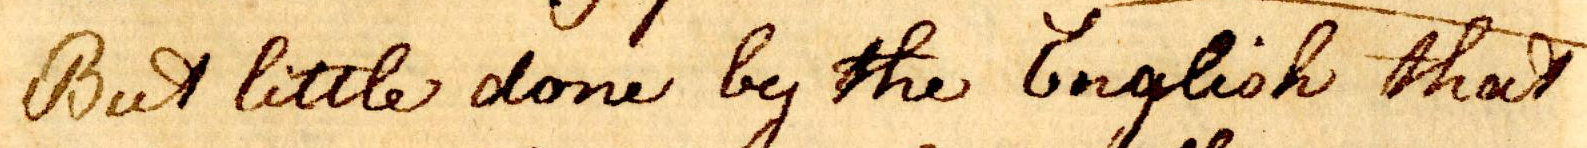But little done by the English that
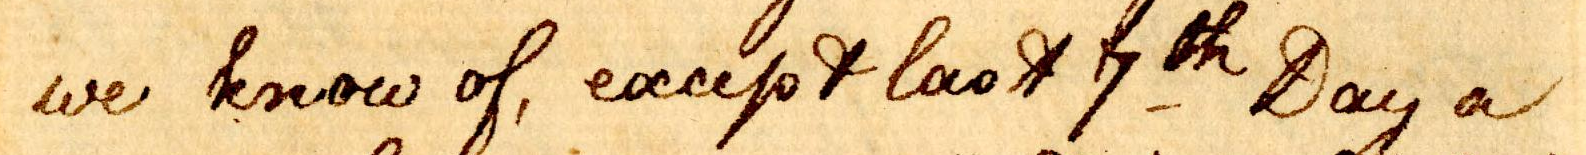we know of, except last 7^th Day a
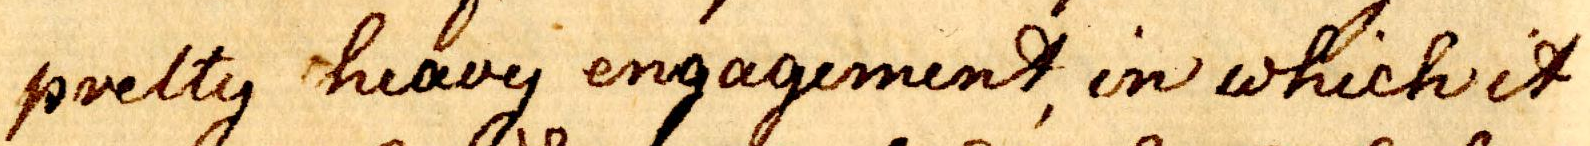pretty heavy engagement in which it
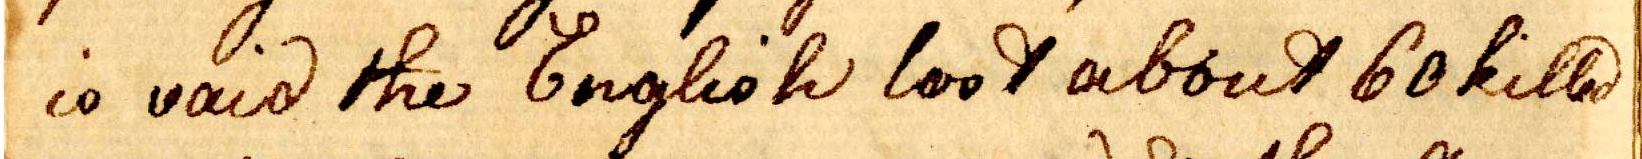is said the English lost about 60 killed
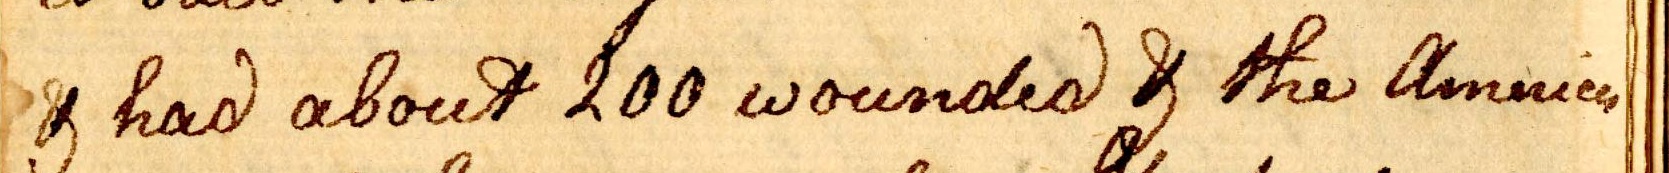& had about 200 wounded & the America
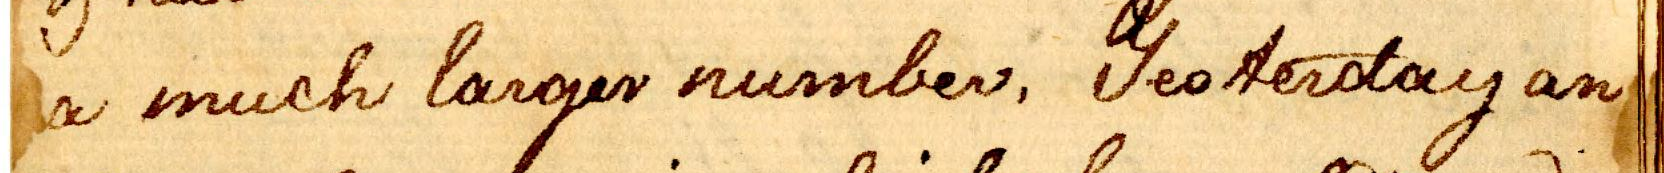a much larger number, Yesterday an
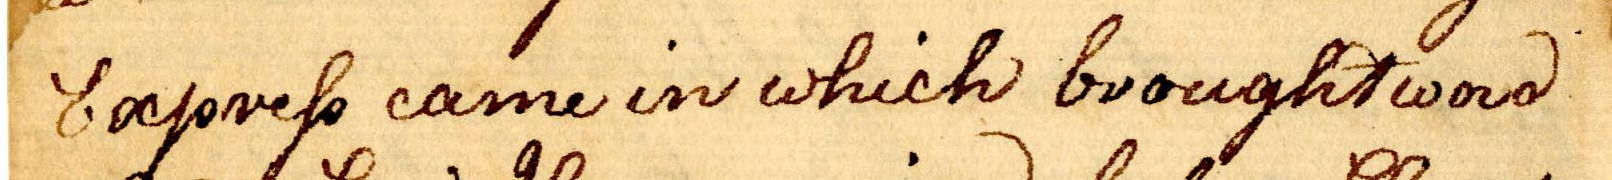Express came in which brought word
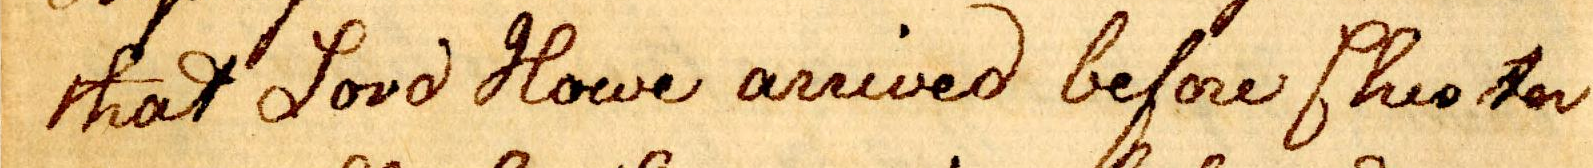that Lord Howe arrived before Chester
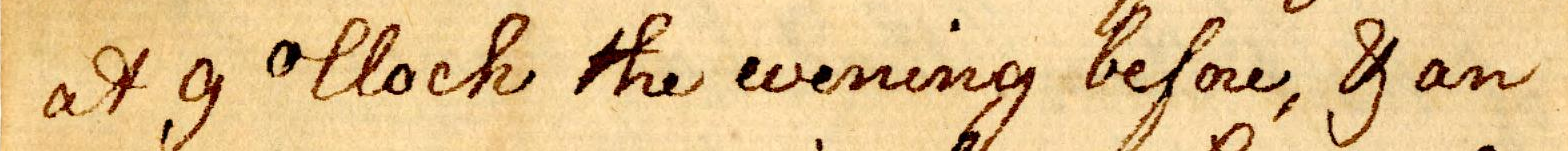at 9 ^oClock the evening before, & an
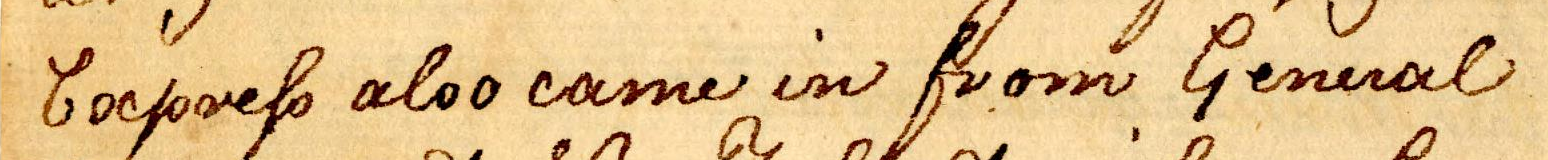Express also came in from General
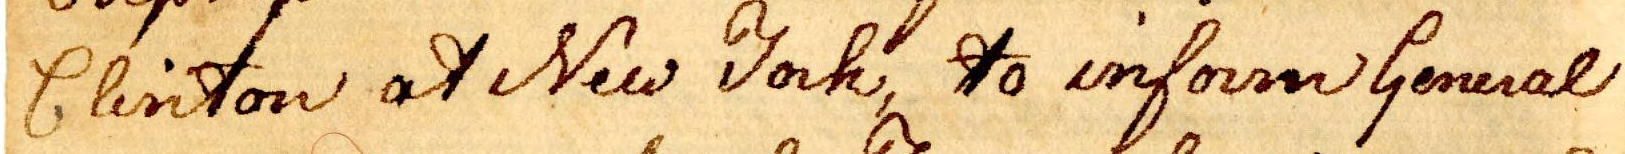Clinton at New York, to inform General
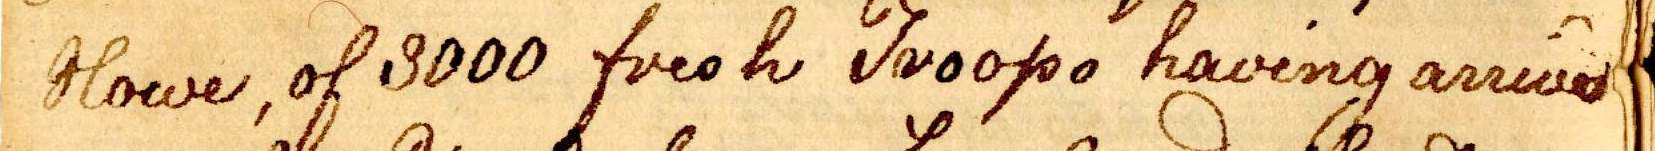Howe, of 3000 fresh Troops having arrived
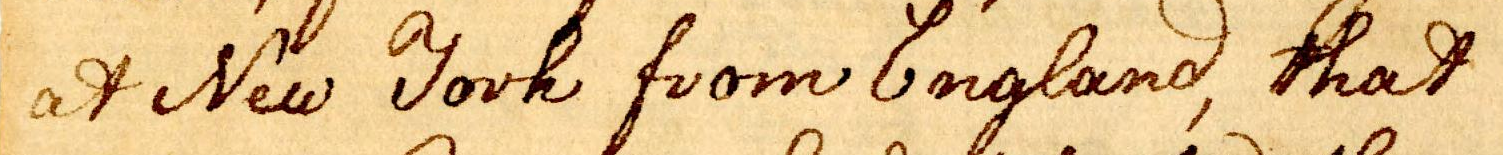at New York from England, that
